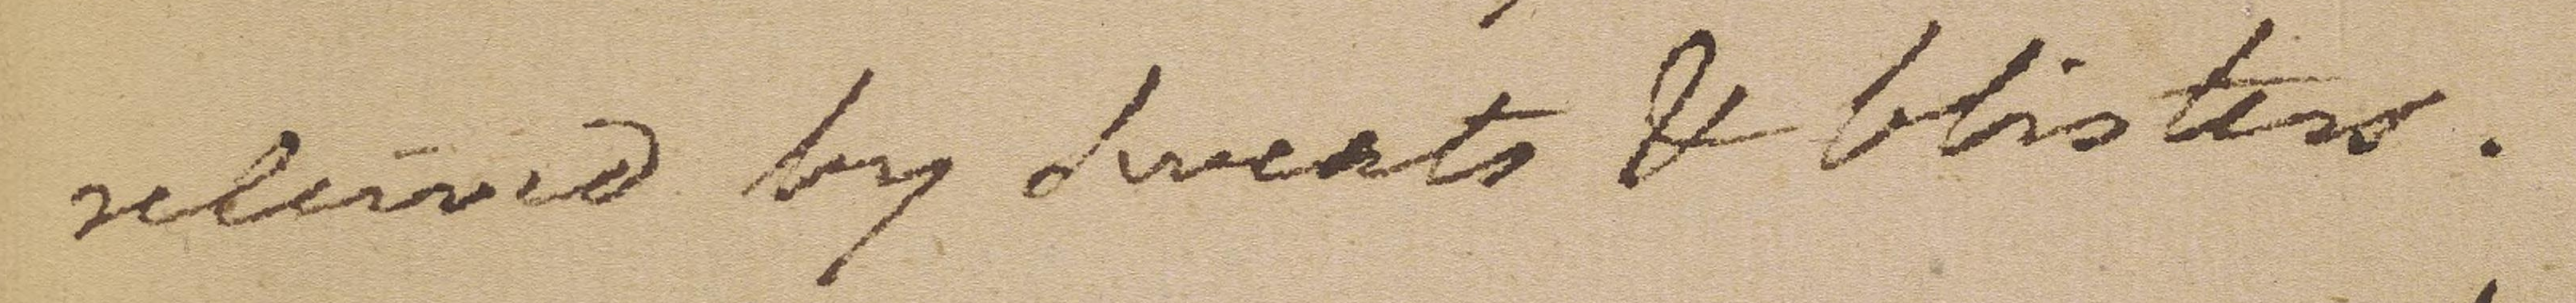releived by sweats & blisters.
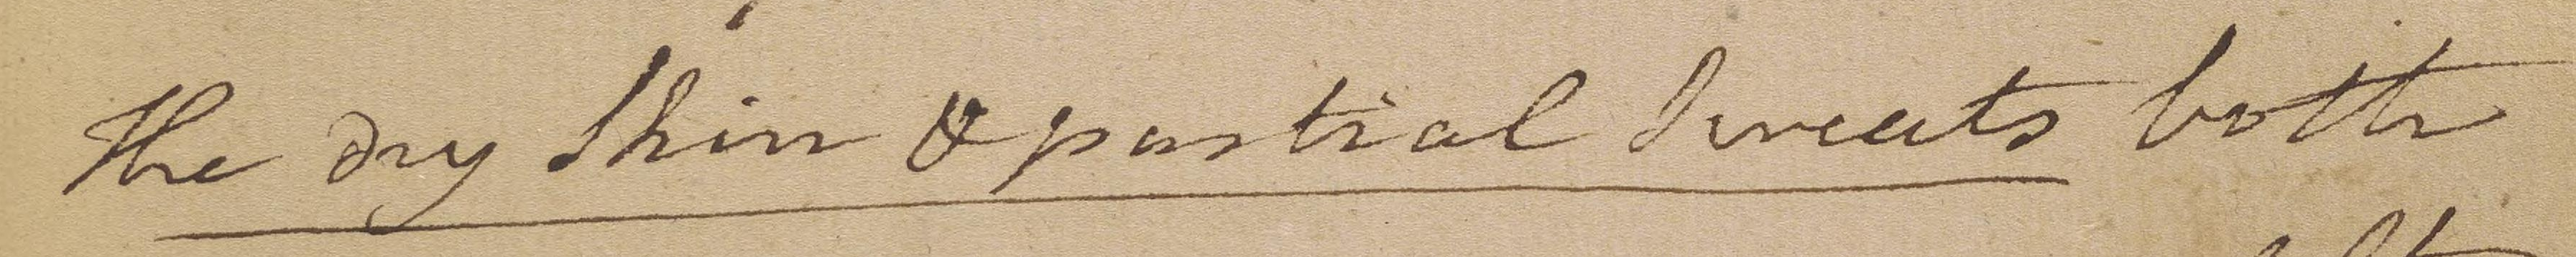The dry skin & partial sweats both
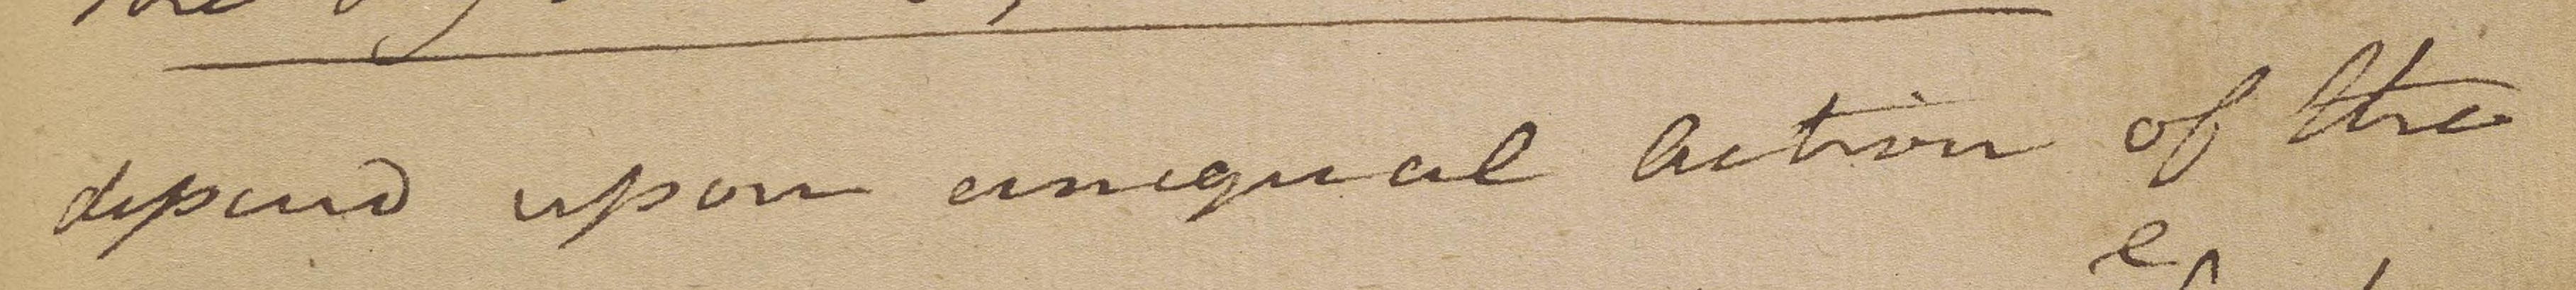depend upon unequal action of the
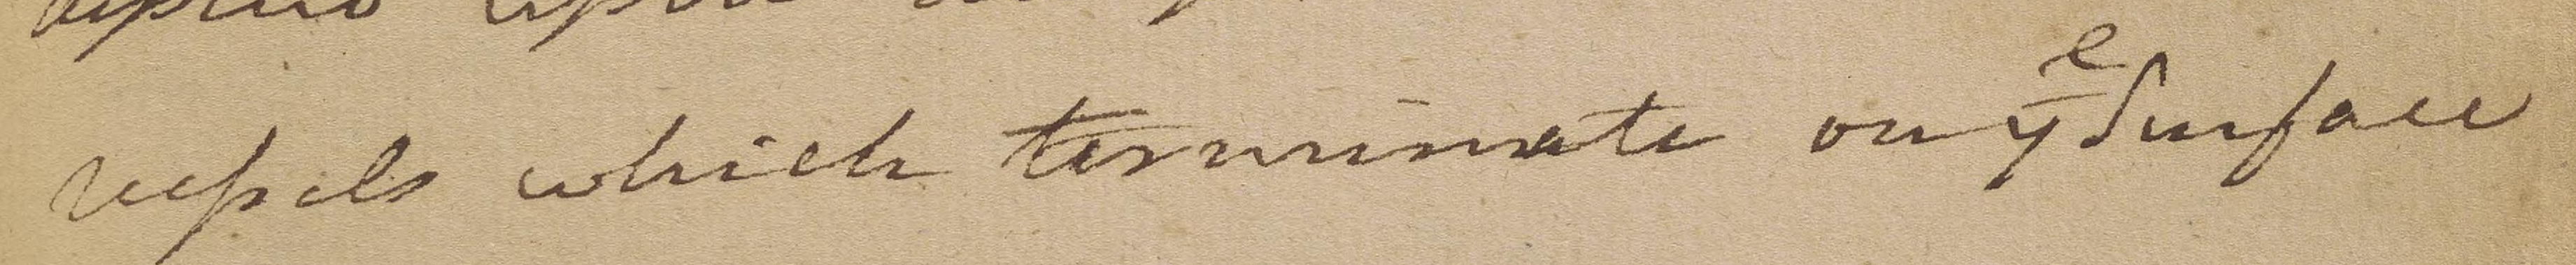vessels which terminate on y^e surface
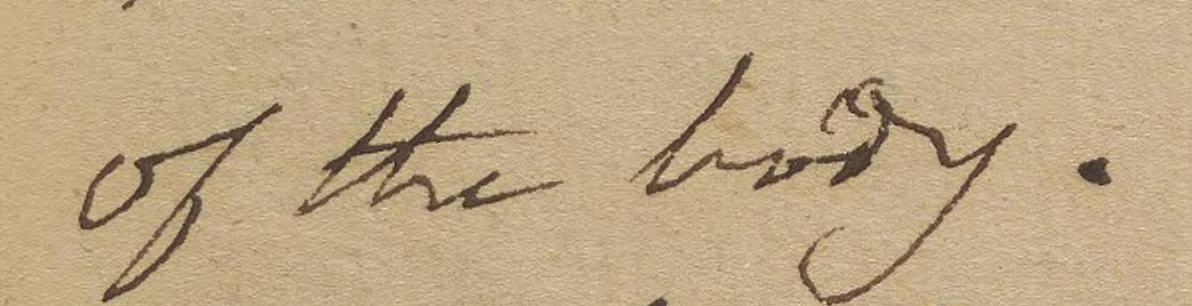of the body.
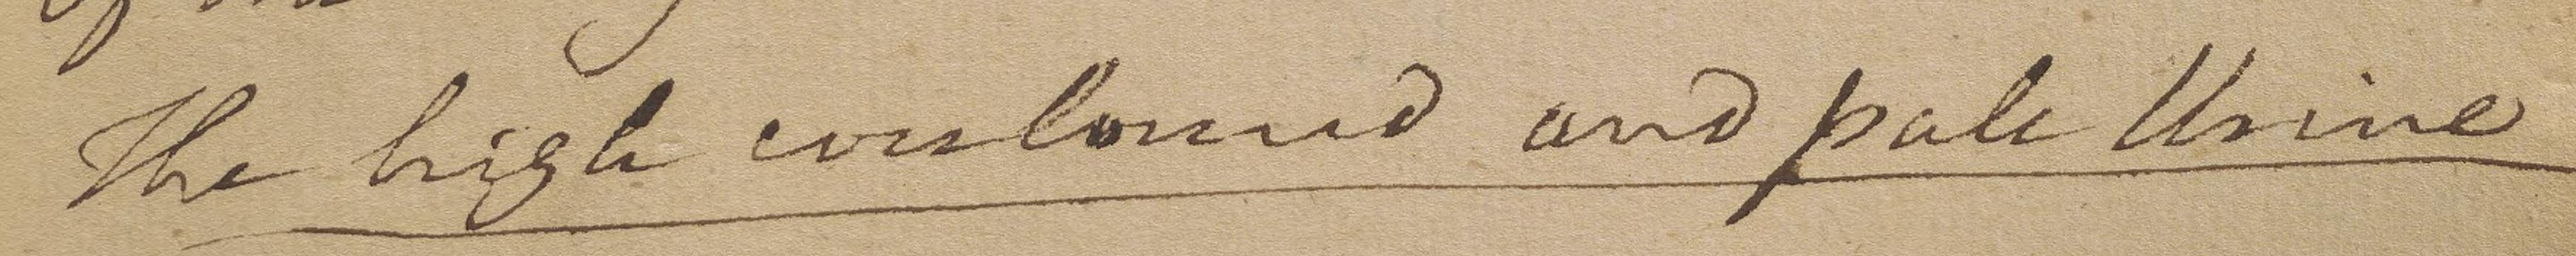The high couloured and pale Urine
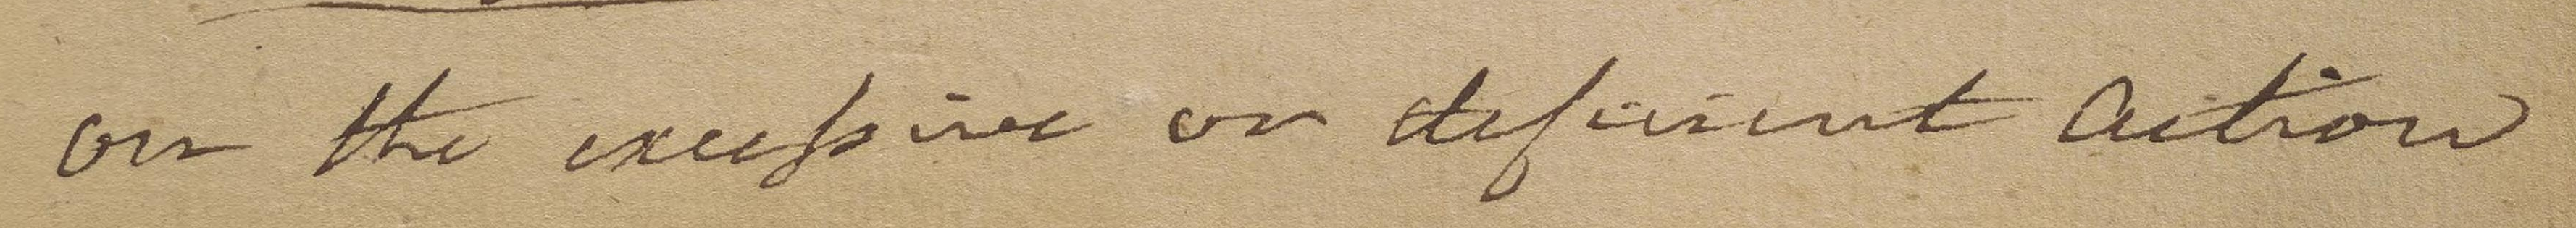or the excessive or deficient action
